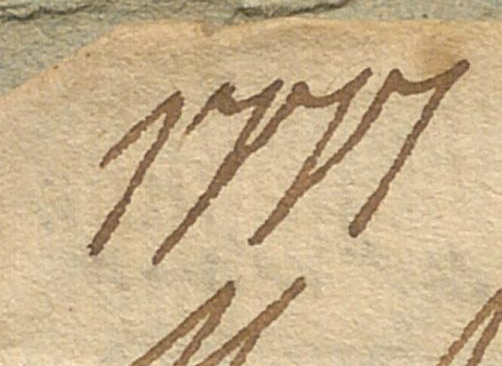1777
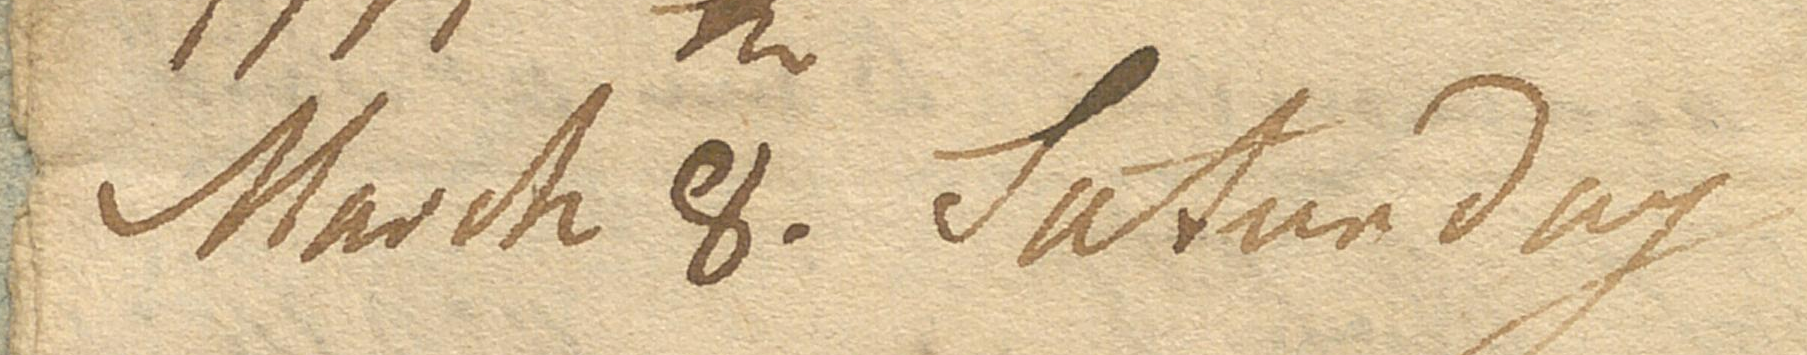March 8^th. Saturday
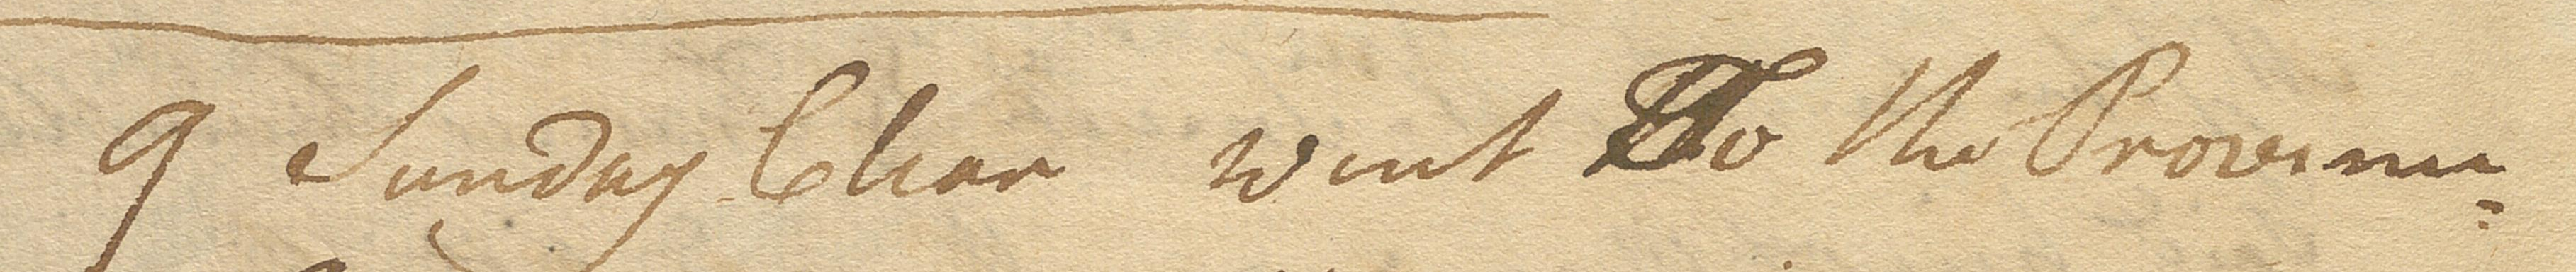9 Sunday Clear went To the Province
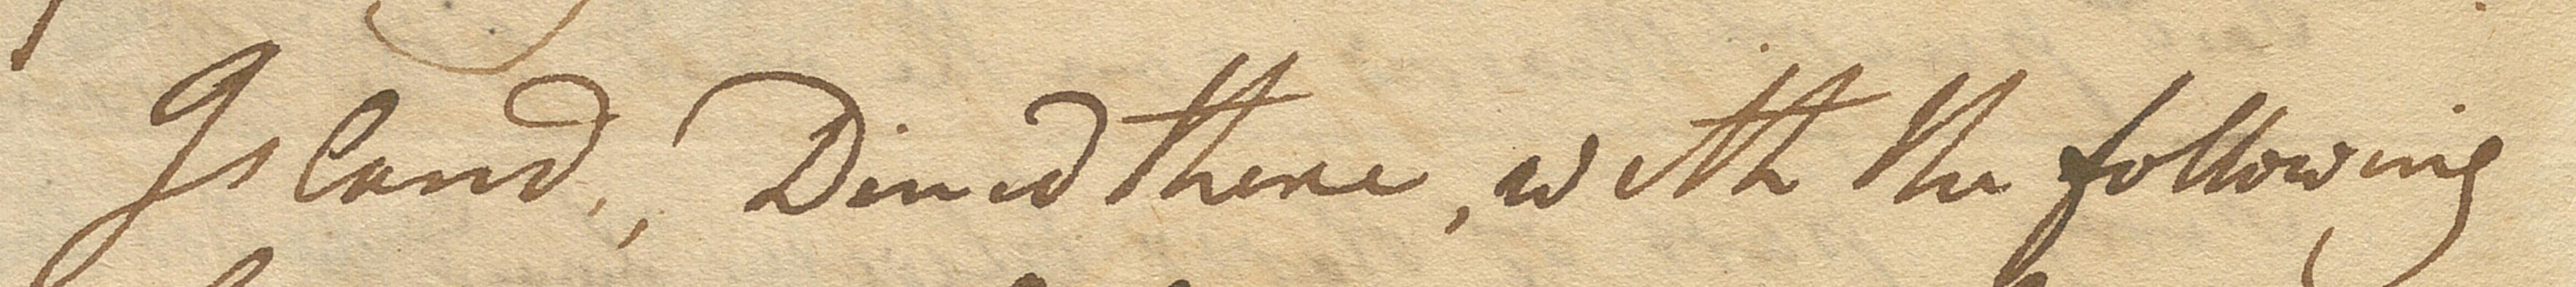Island. Dined there with the following
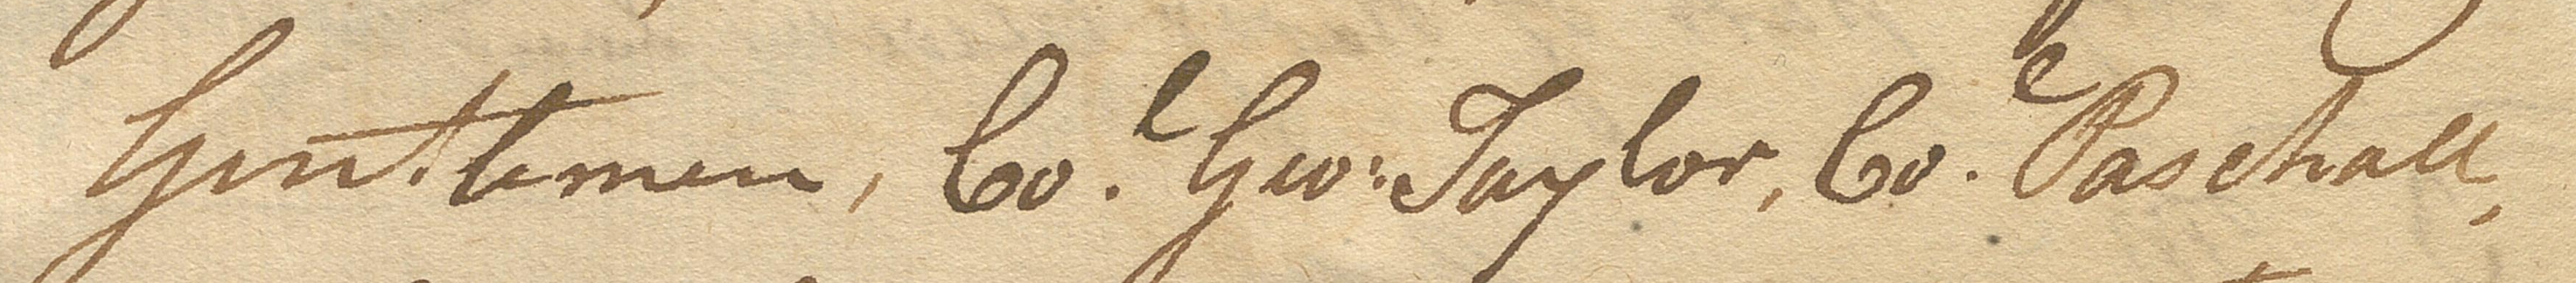Gentlemen, Co^l. Geo^. Taylor, Co^l. Paschall
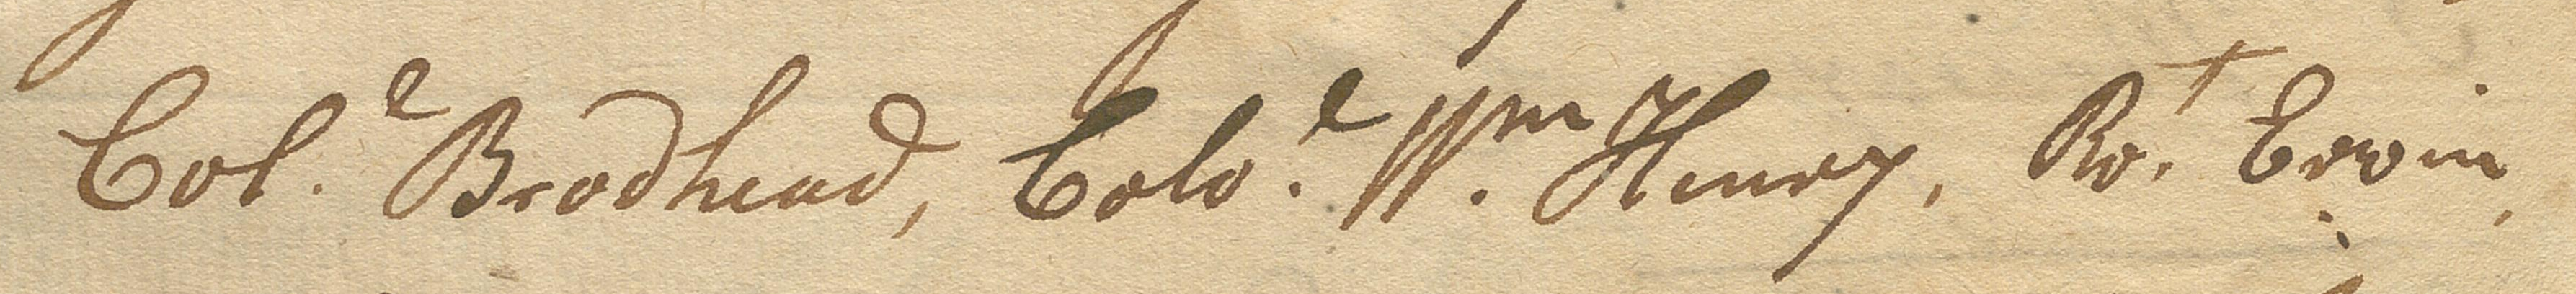Col^. Brodhead. Colo^l. W^m. Henry, Ro^t. Erwin
